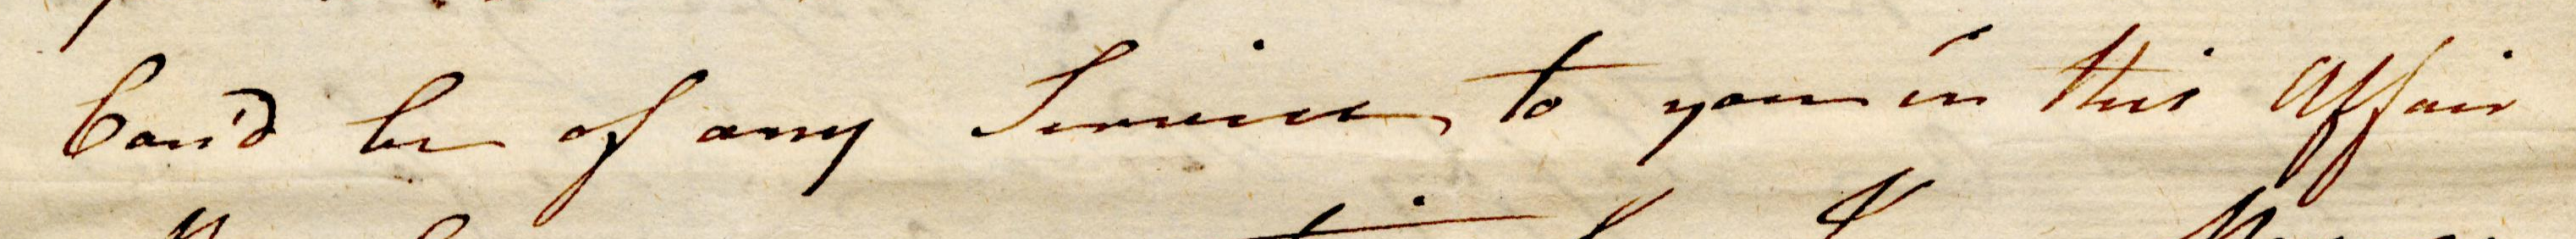Cou'd be of any service to you in this affair
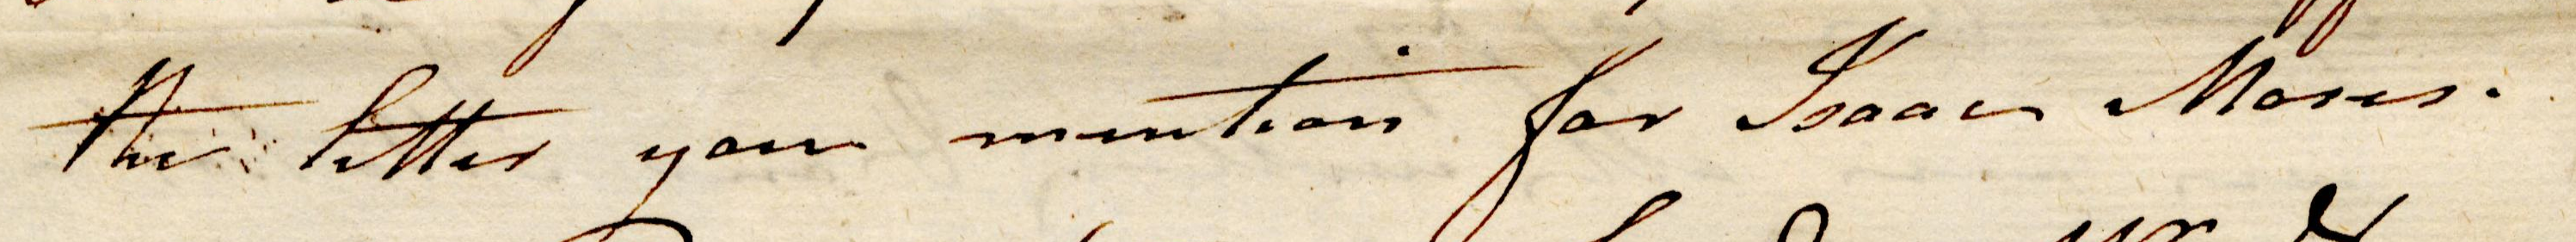the letter your mention for Isaac Moses.
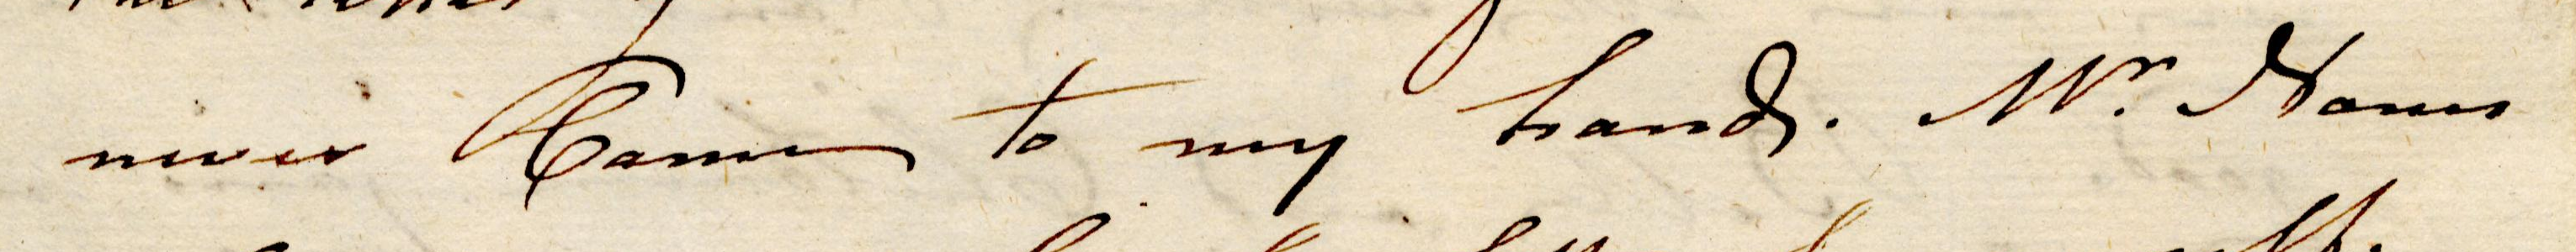never came to my hand. M^r. Narus
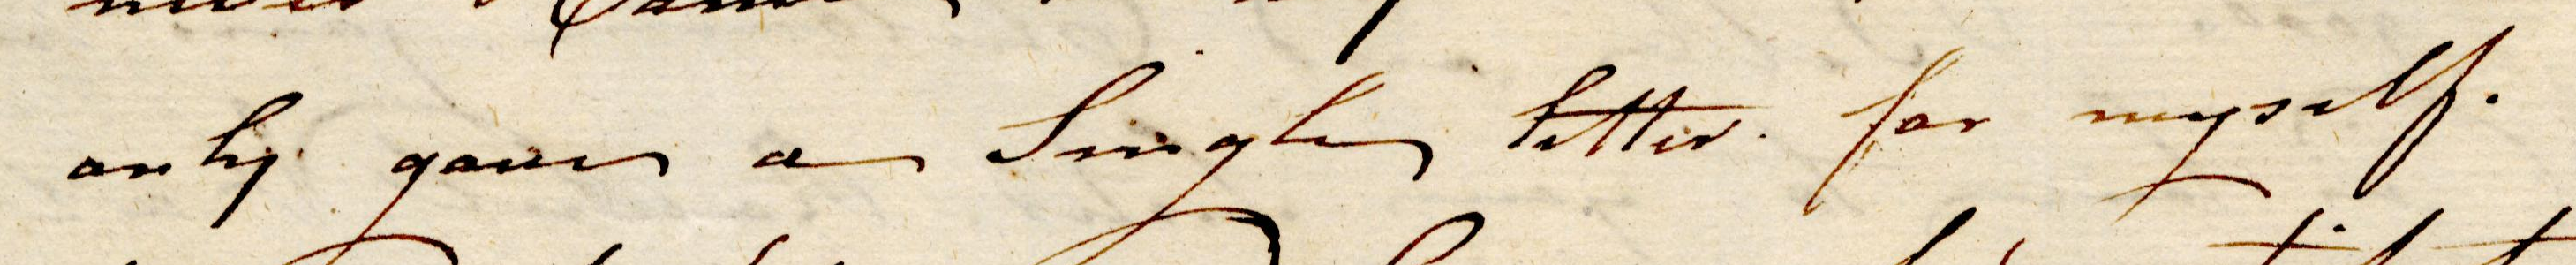or by gaven a single letter for myself
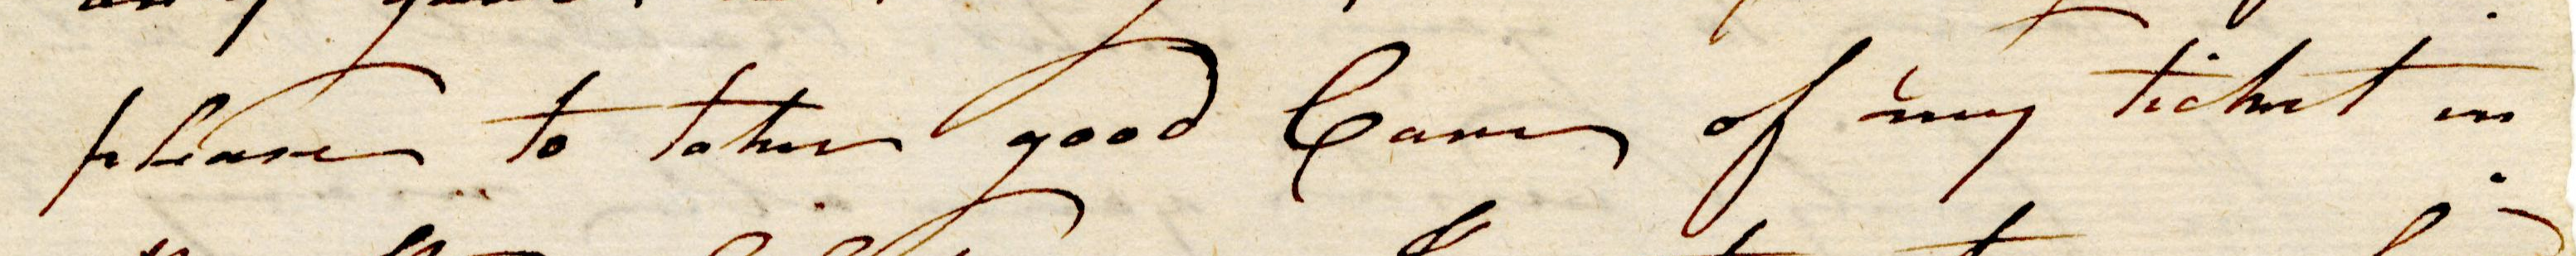please to toke good Care of my ticket in
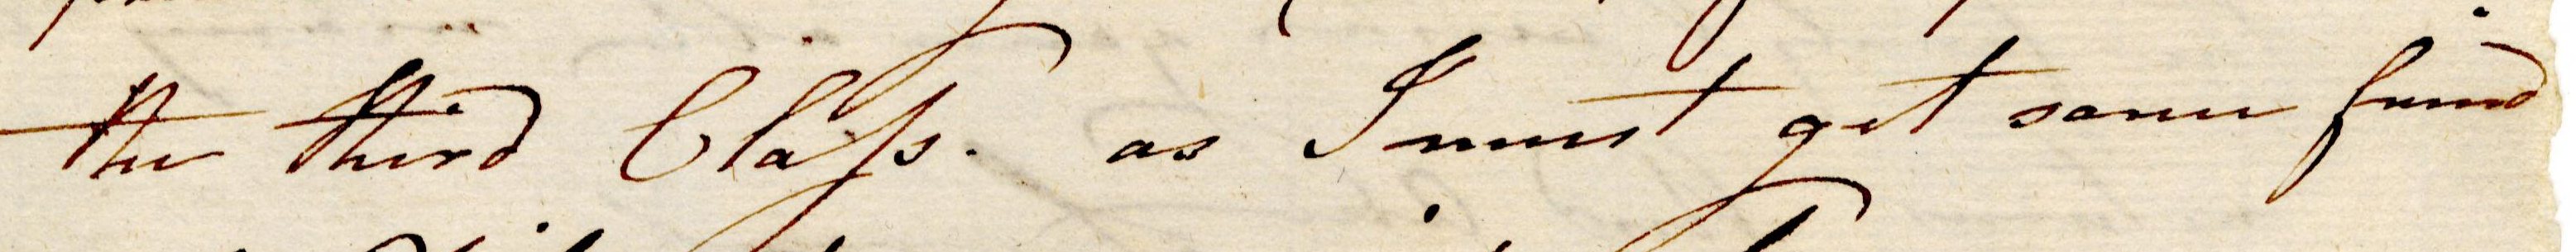the third Class. as I must get some fund
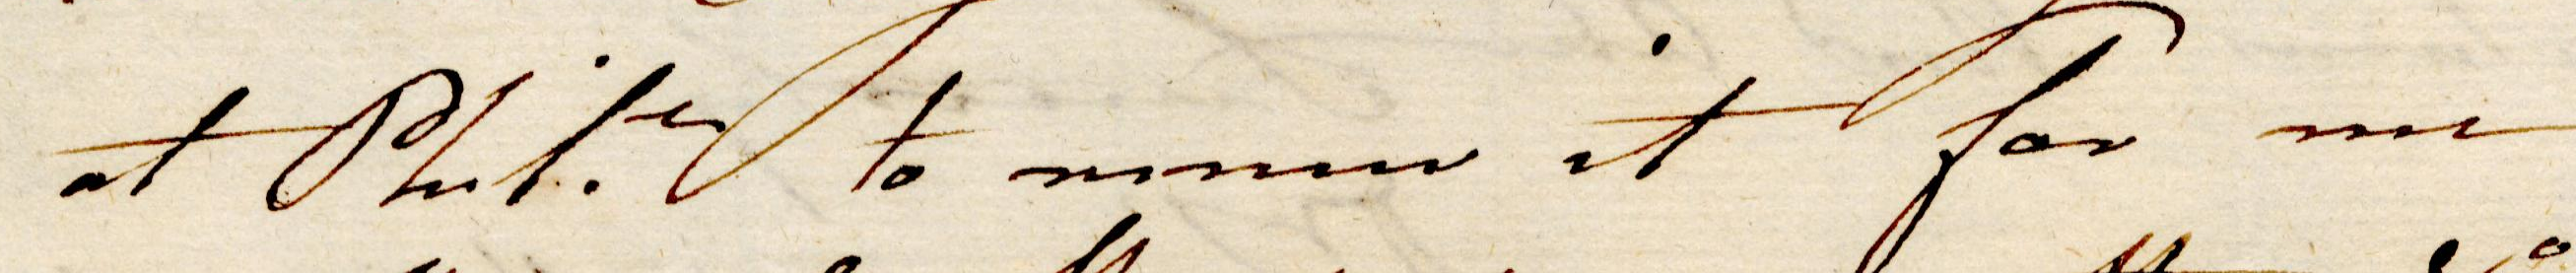at Phil^a. to morrow it for me
